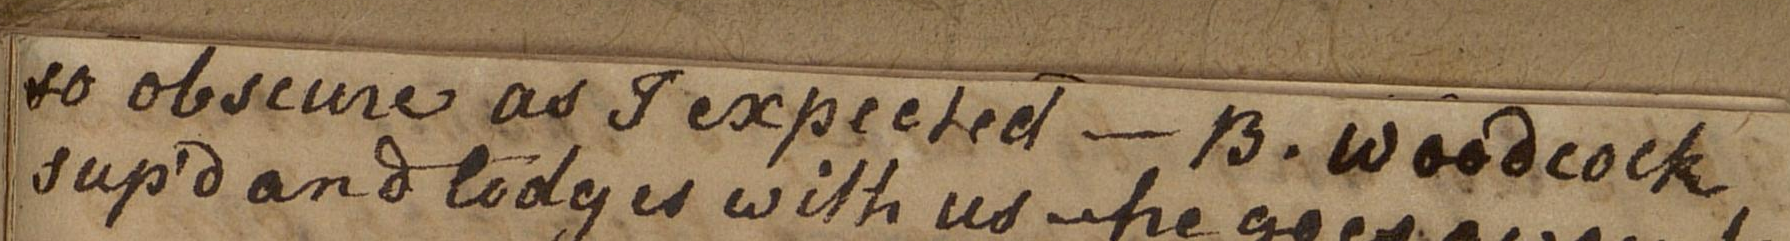so obscure as I expected- B. Woodcock,
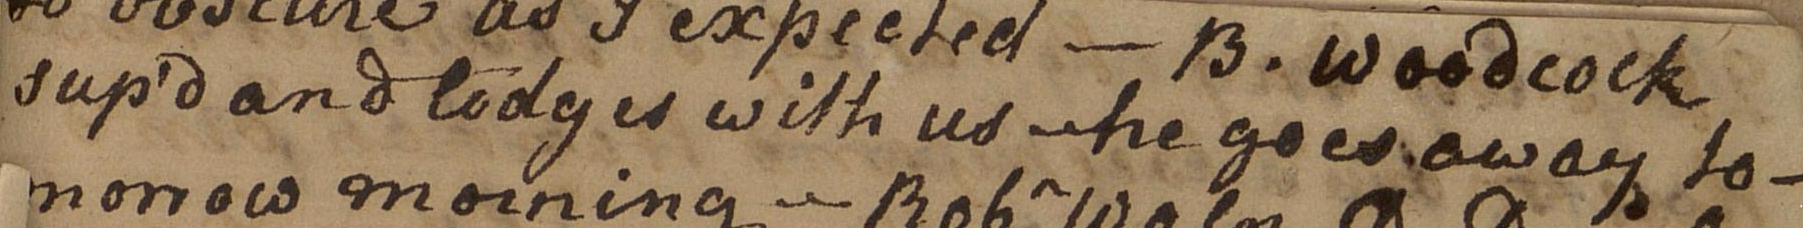sup'd and lodges with us- he goes away to-
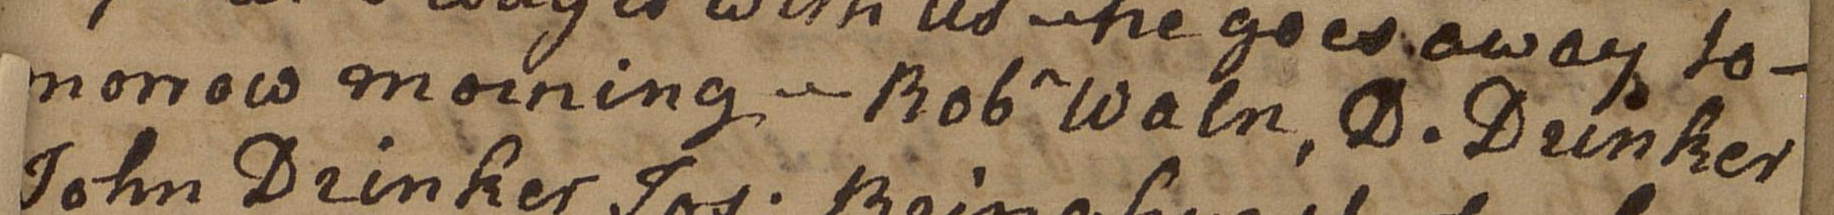morrow morning- Rob^r Waln, D. Drinker
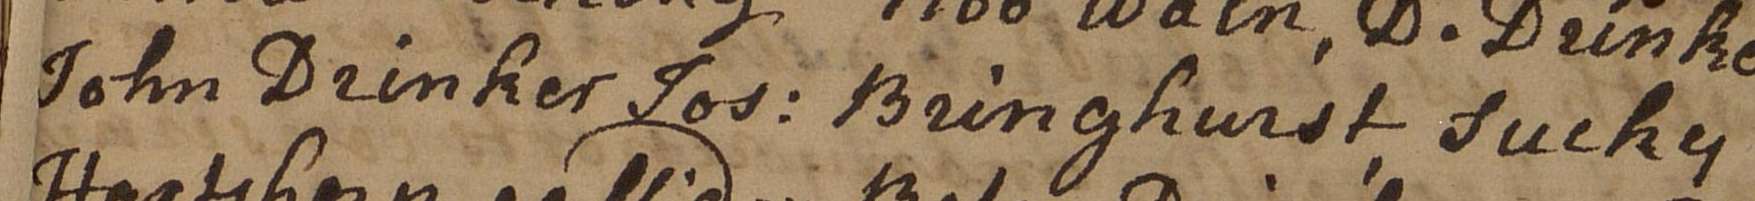John Drinker Jos: Bringhurst, Sucky
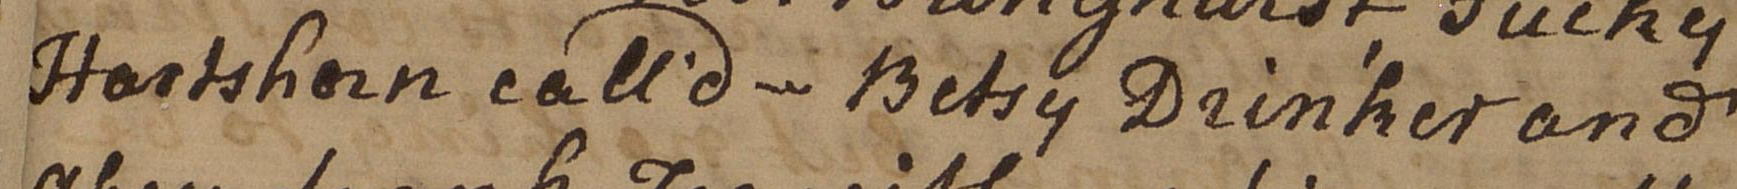Hartshorn call'd- Betsy Drinker and
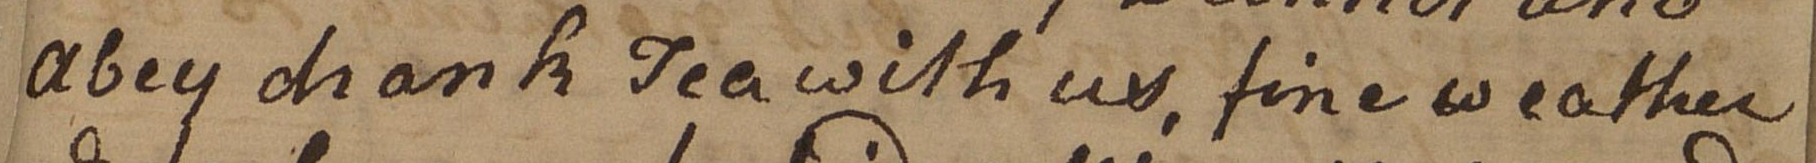Abey drank Tea with us, fine weather
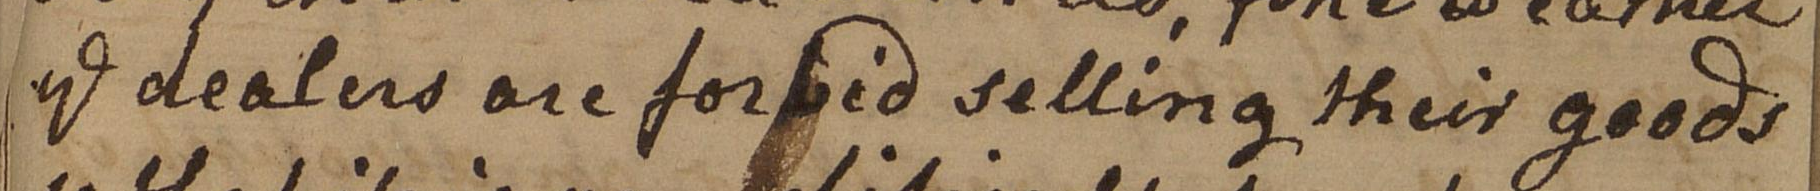y^e dealers are forbid selling their goods
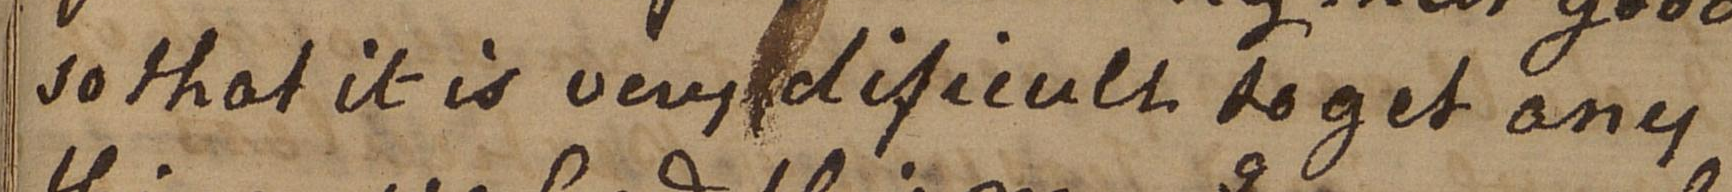so that it is very dificult to get any
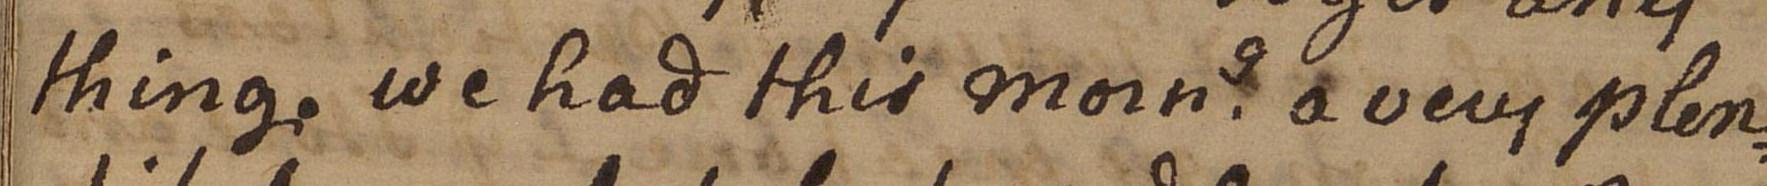thing. we had this morn^g. a very plen-
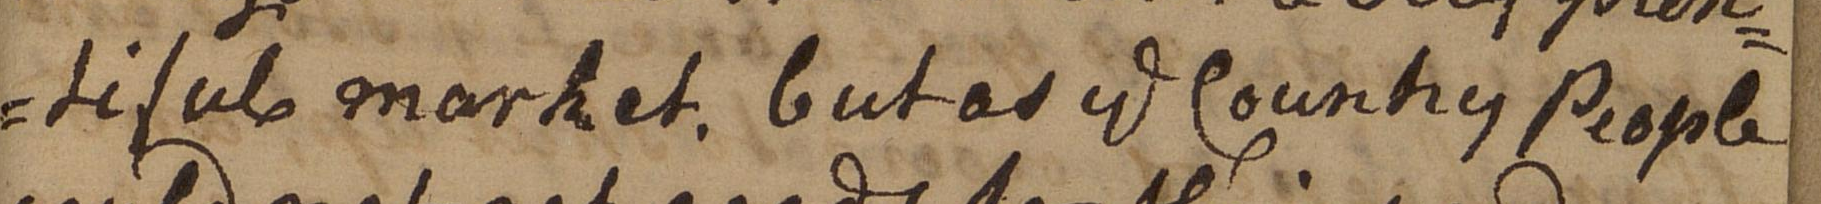-tiful market, but as y^e Country People
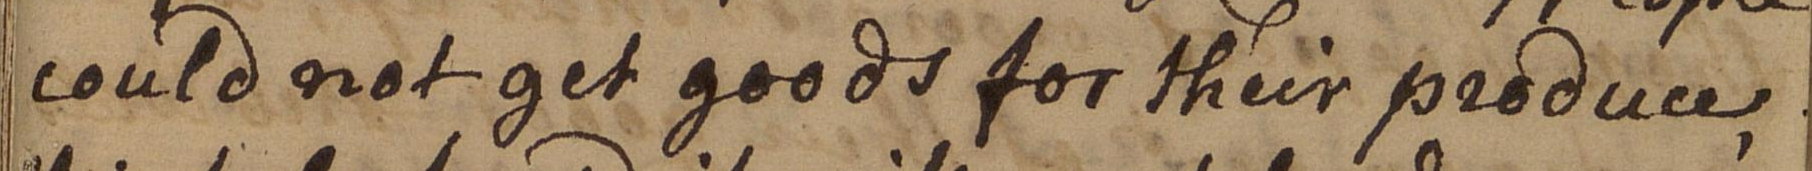could not get goods for their produce,
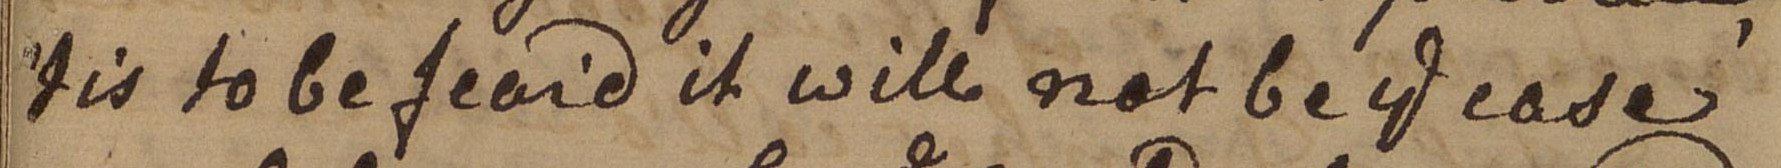'tis to be fear'd it will not be y^e case
